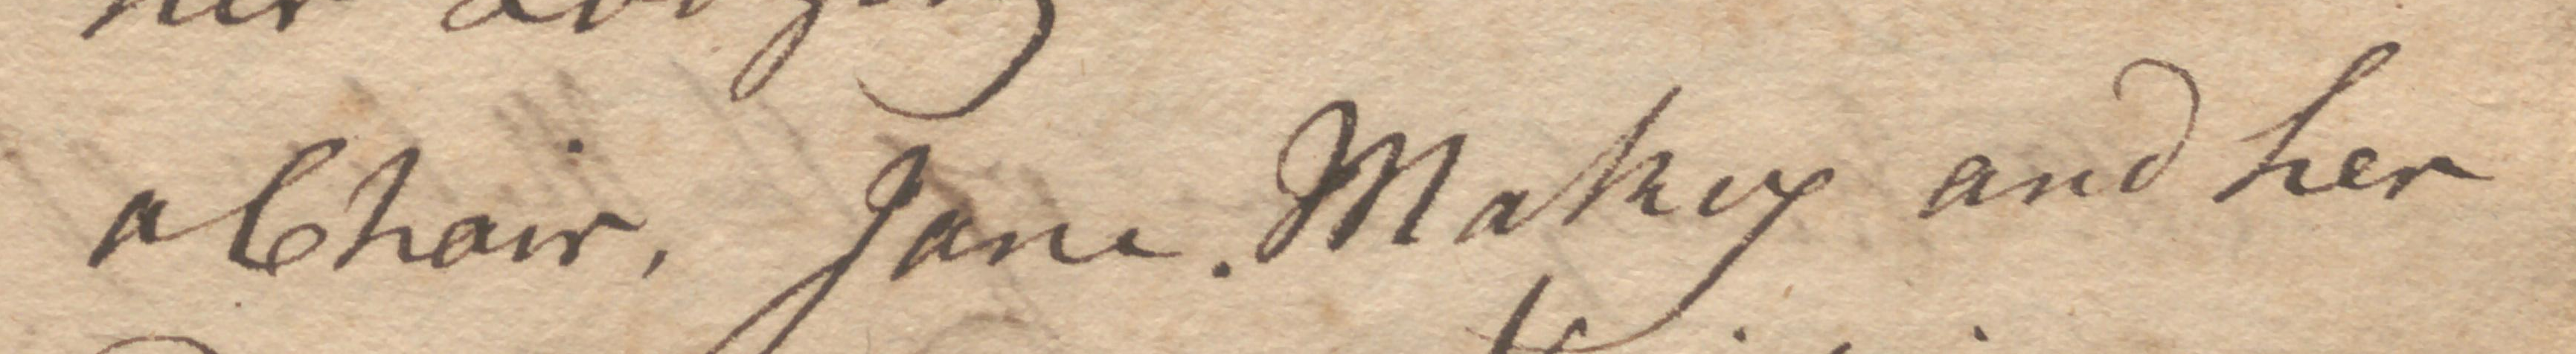a Chair, Jane Makey and her
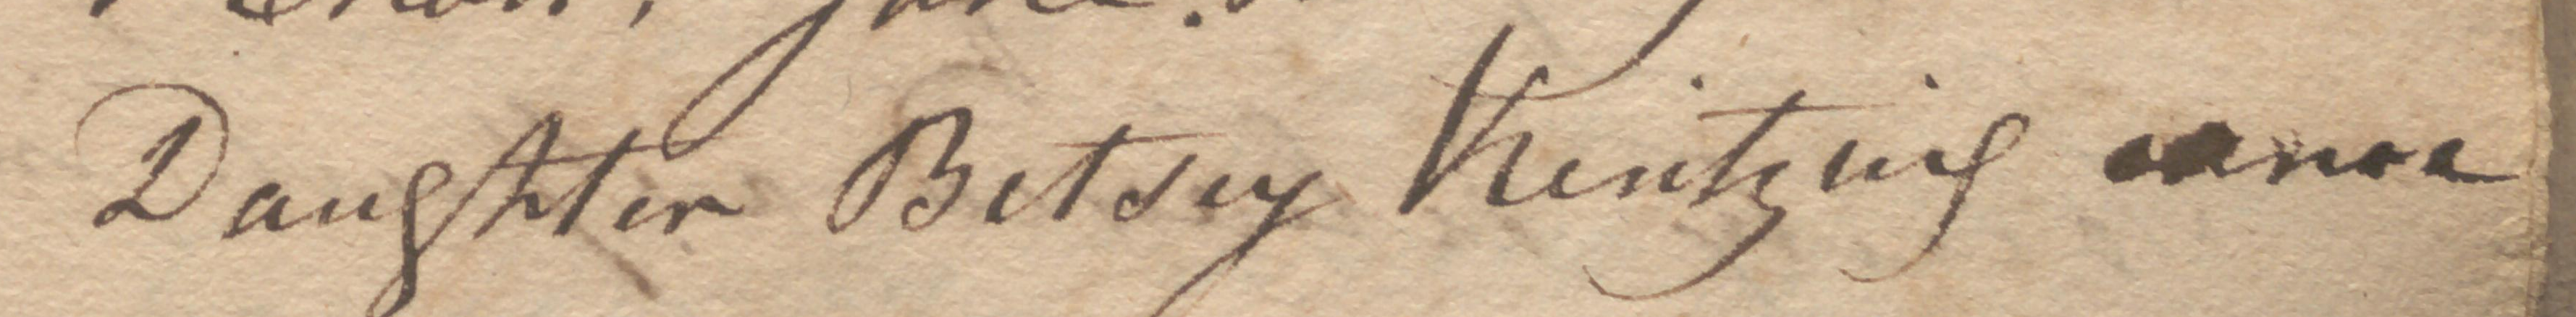Daughter Betsey Kintzing came
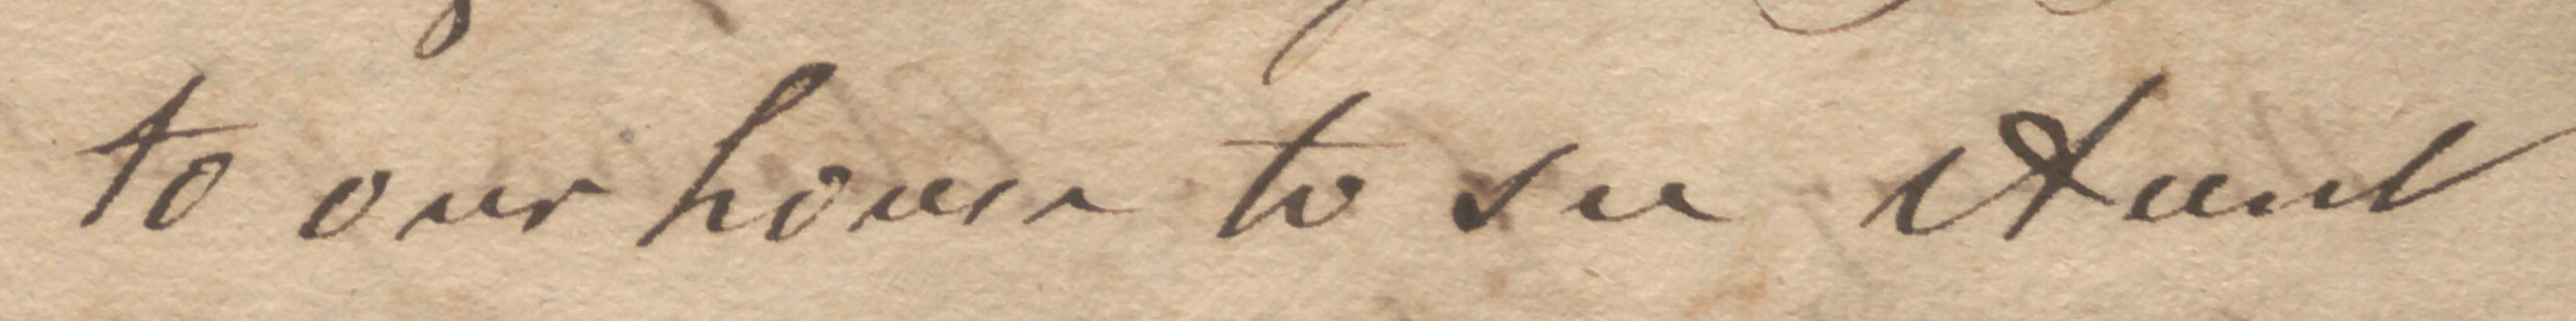to our house to see Aunt
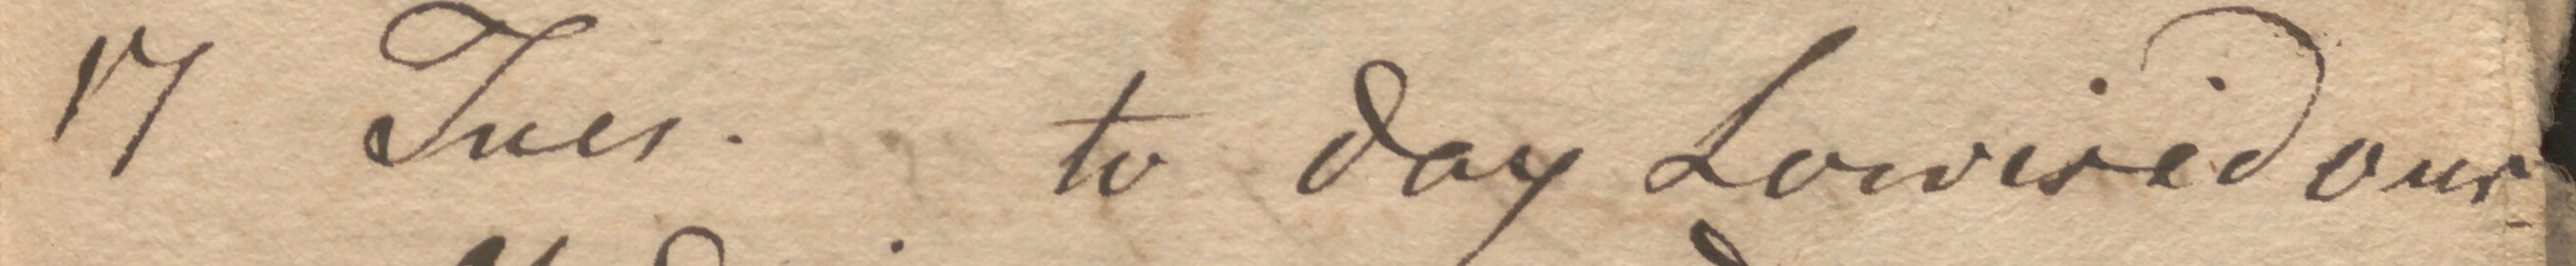17 Tues. to day Lowered our
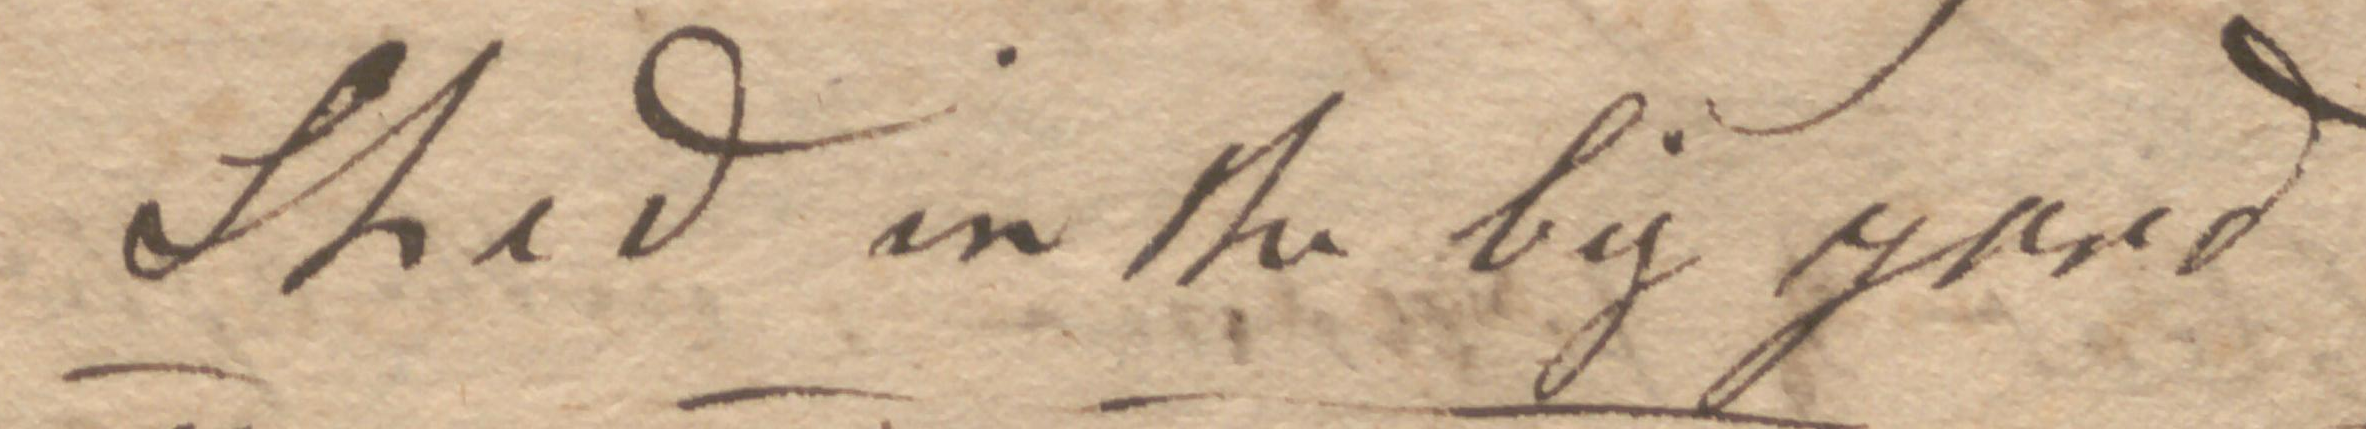shed in the big yard
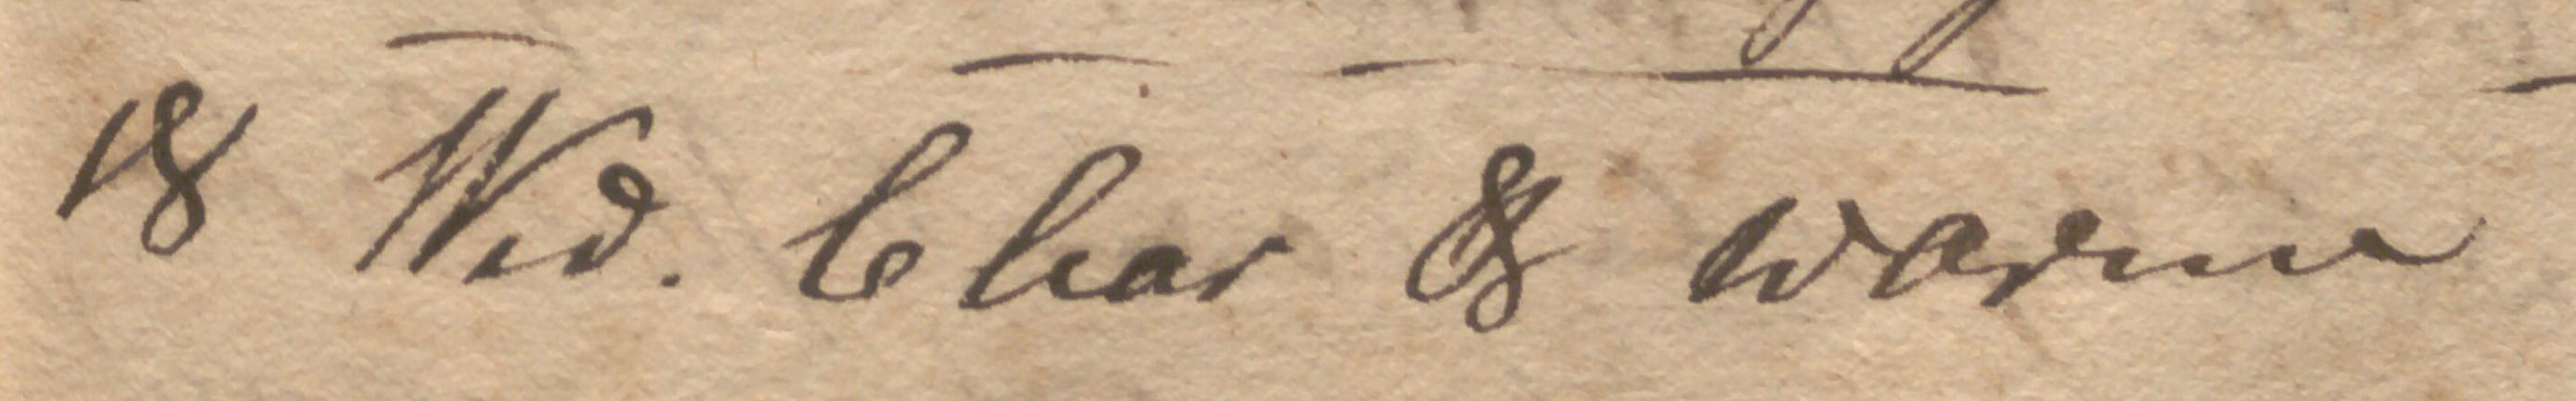18 Wed. Clear & warme
